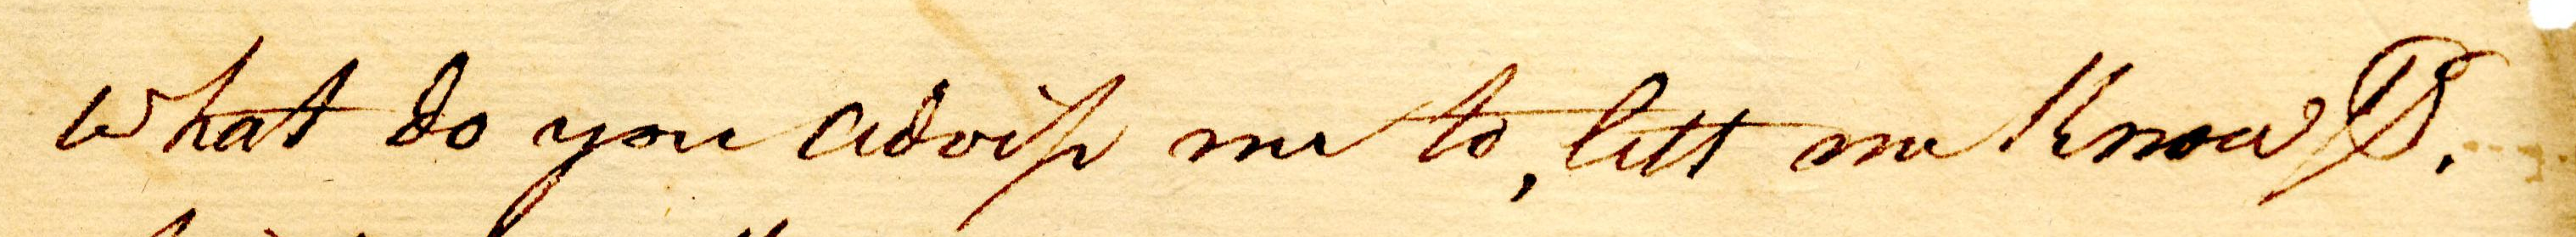what do you advise me to, lett on Know p^r.
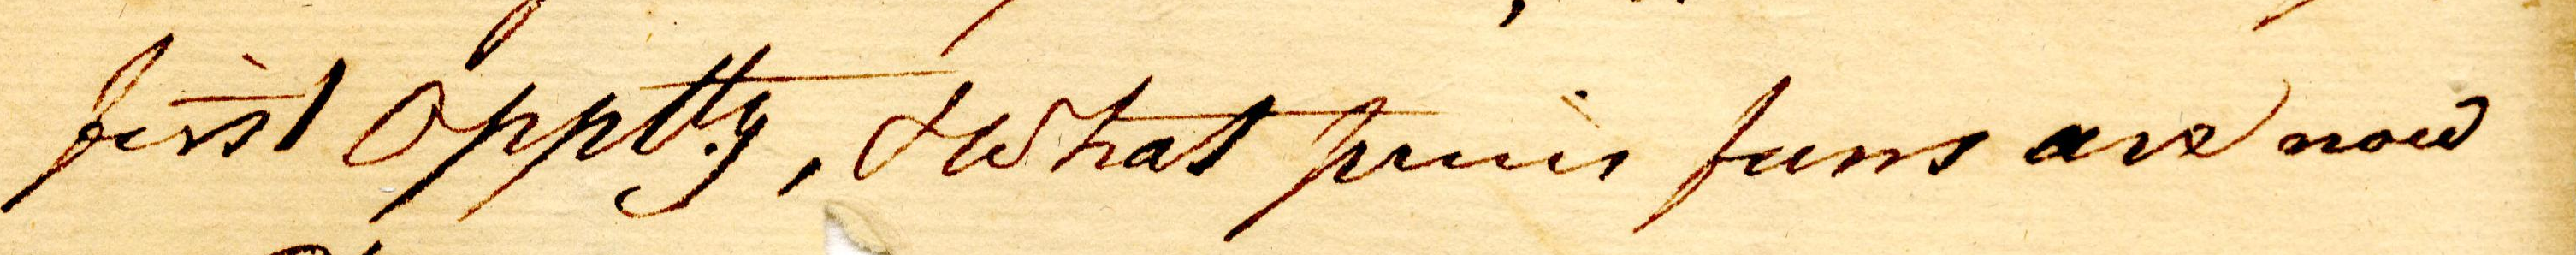first Oppt^ty, & what prices furs are now
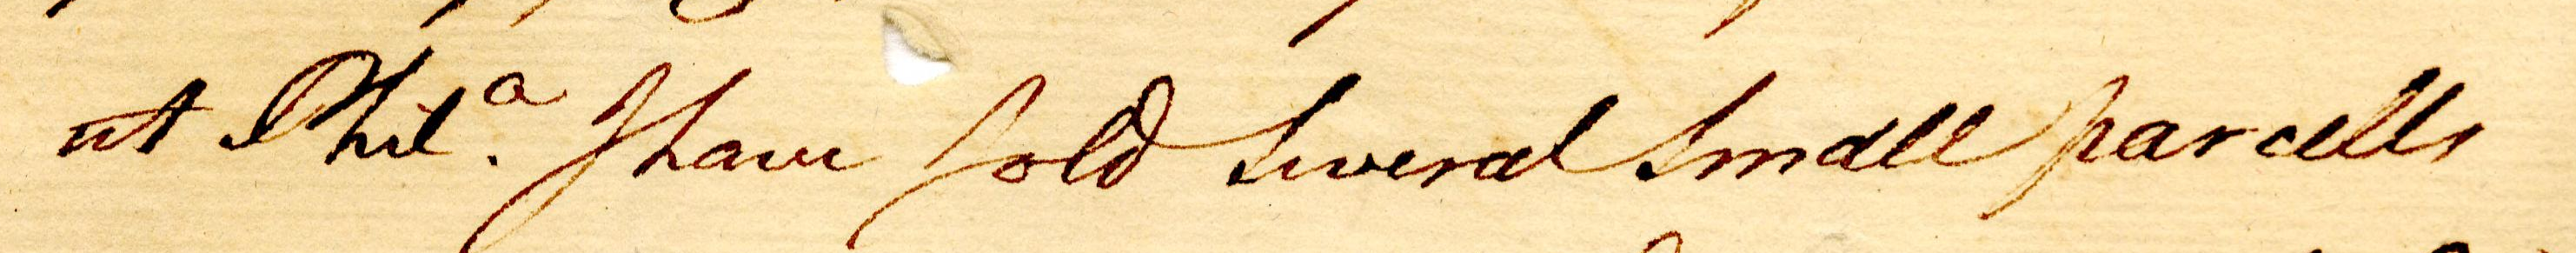at Phil^a. I have sold Several Small parcells
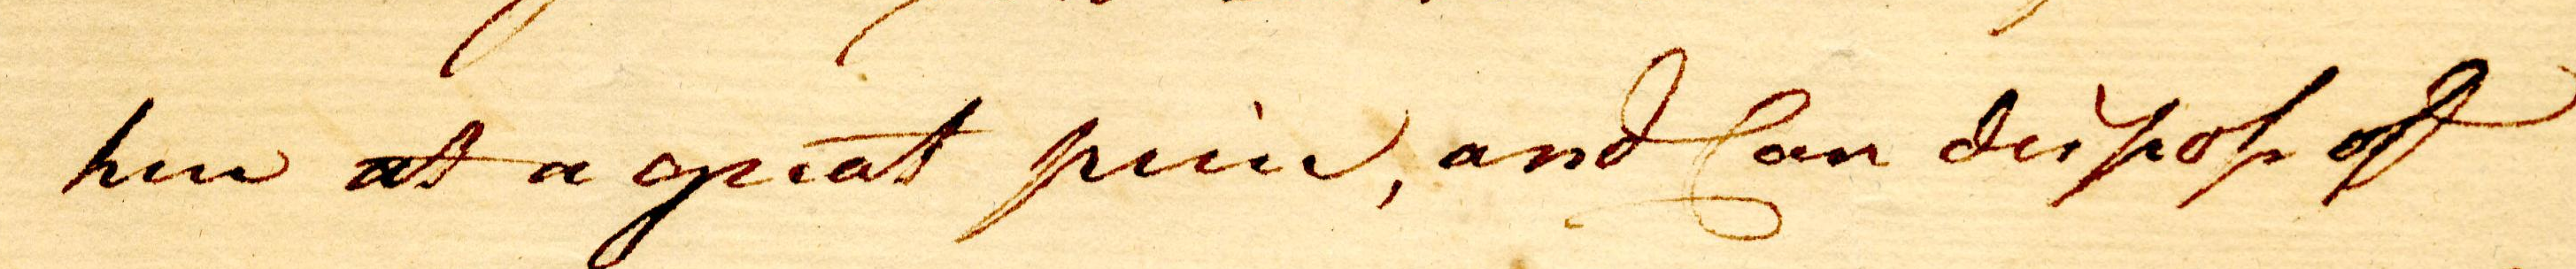here at a great price, and can dispose of
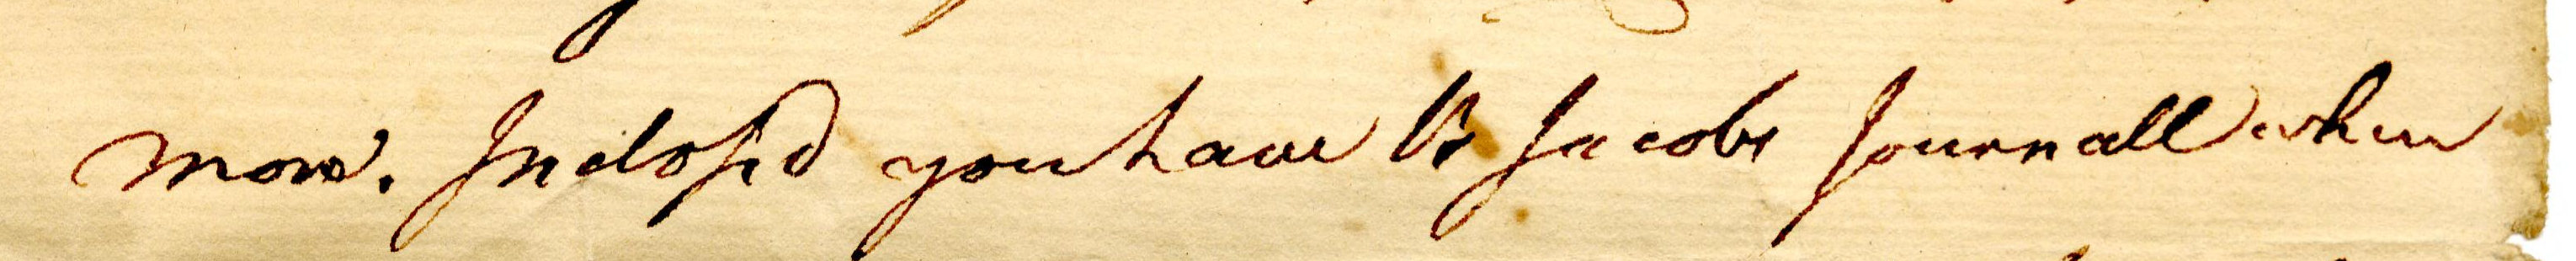more. Inclosd you have B Jacobs Journall when
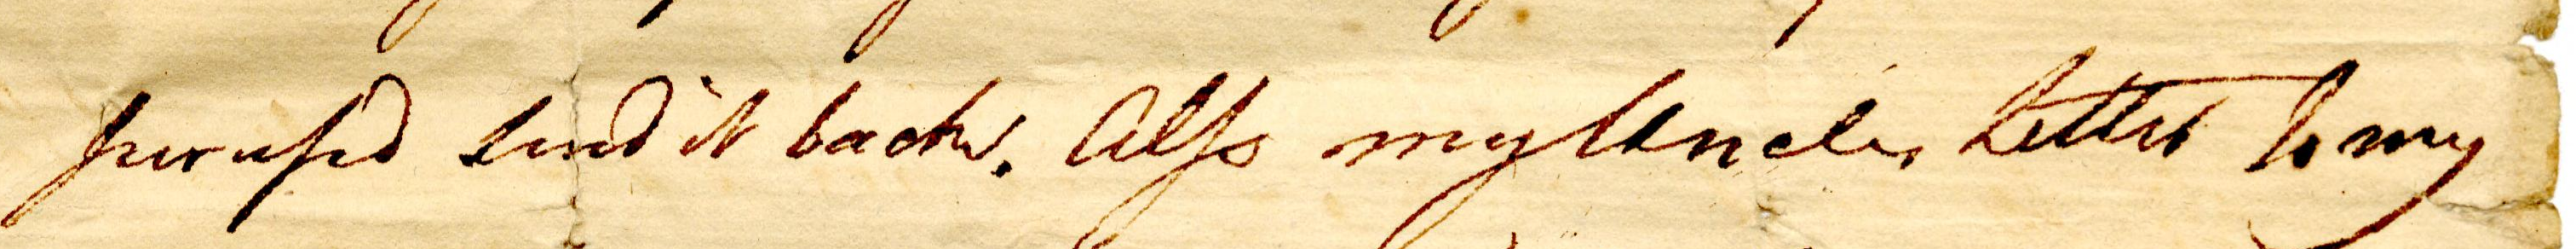perused send it back. Also my Uncle, letter to my
